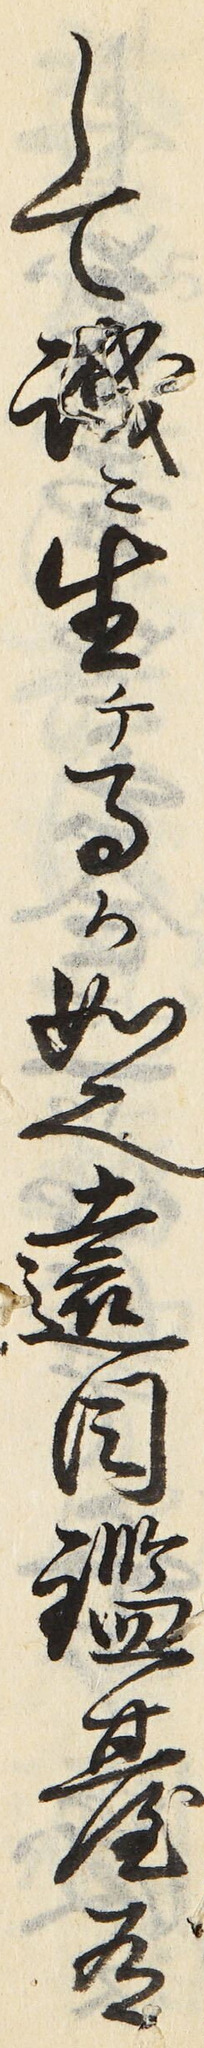して誠に生けるか如也遠目鑑台有
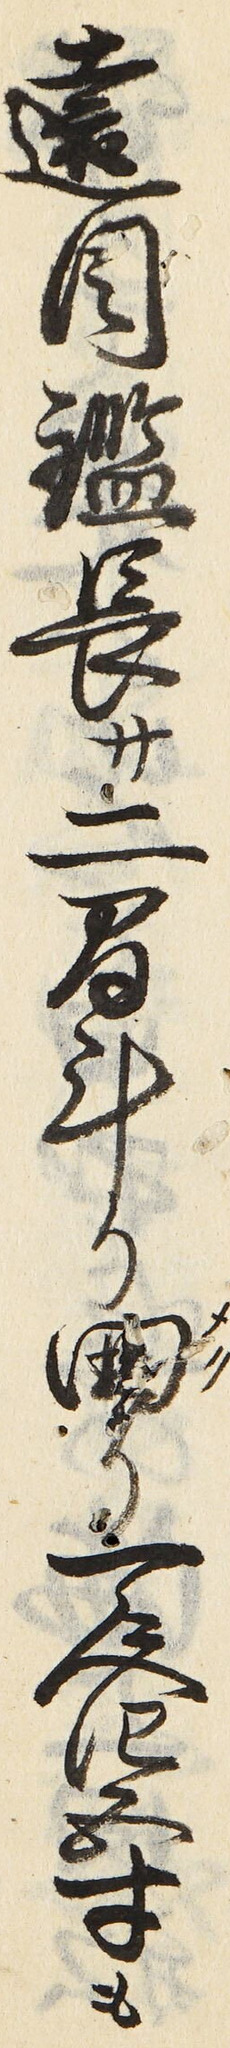遠目鑑長さ二間計り回り一尺四五寸も
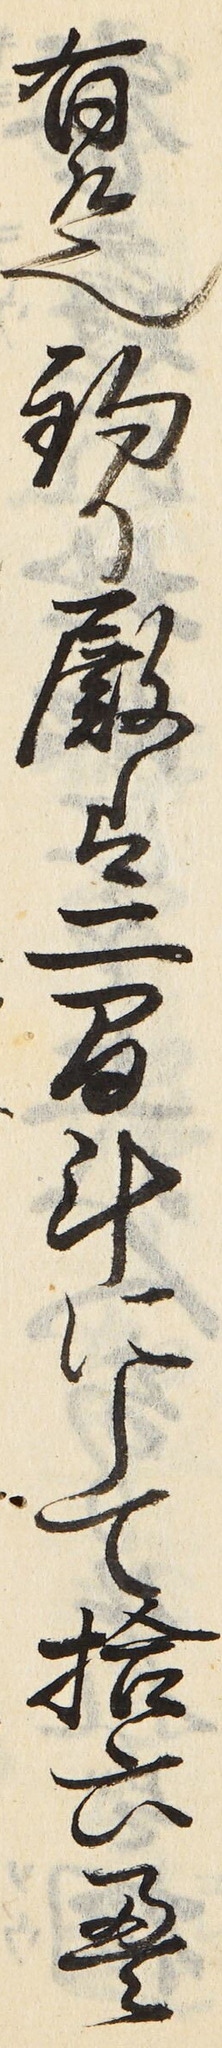有る也釣り殿は二間計にして拾六畳
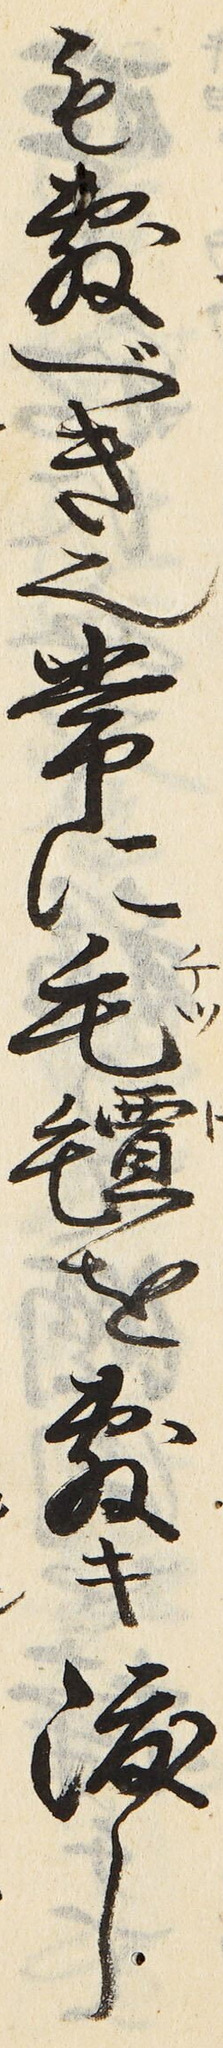も敷べき也常に毛氈を敷き渡し
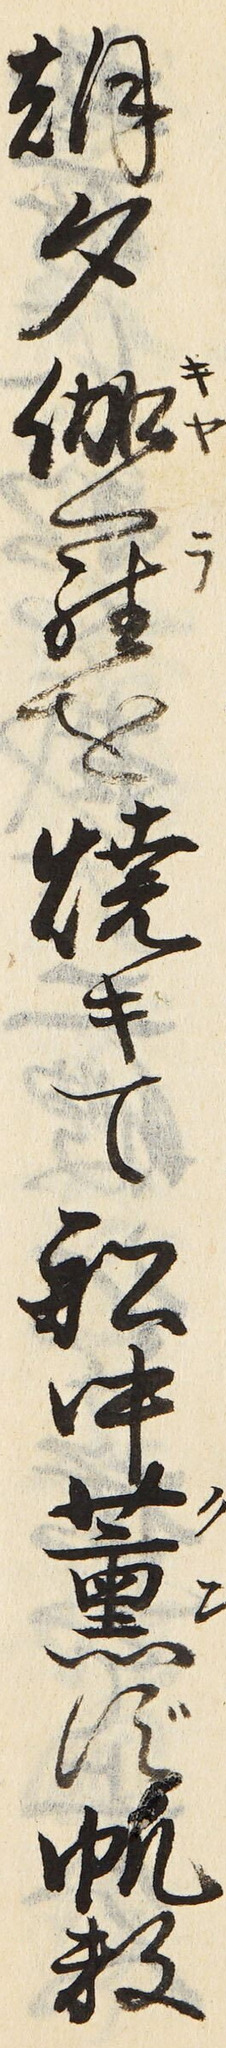朝夕伽羅を焼きて船中薫ず帆数
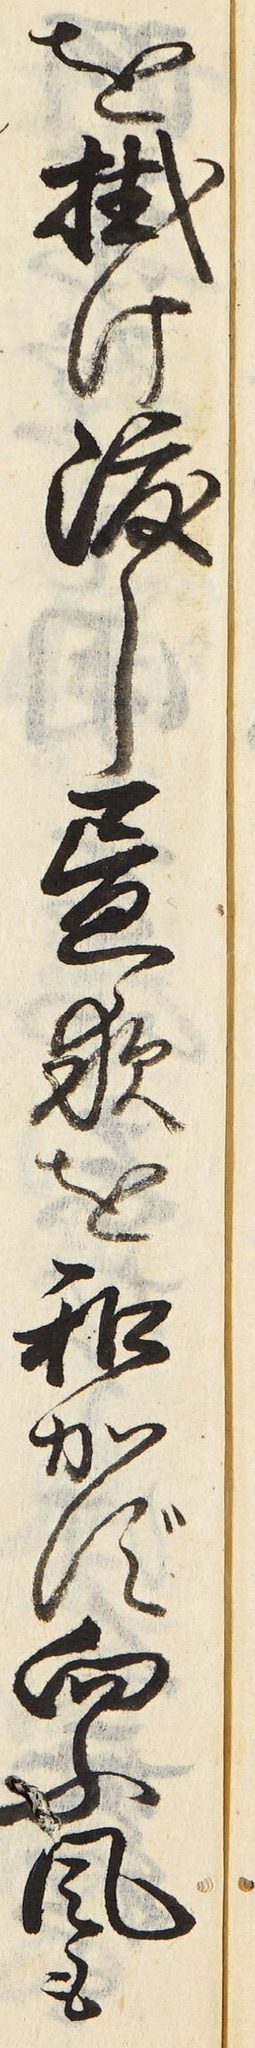を掛け渡し昼夜をわかず向ふ風も
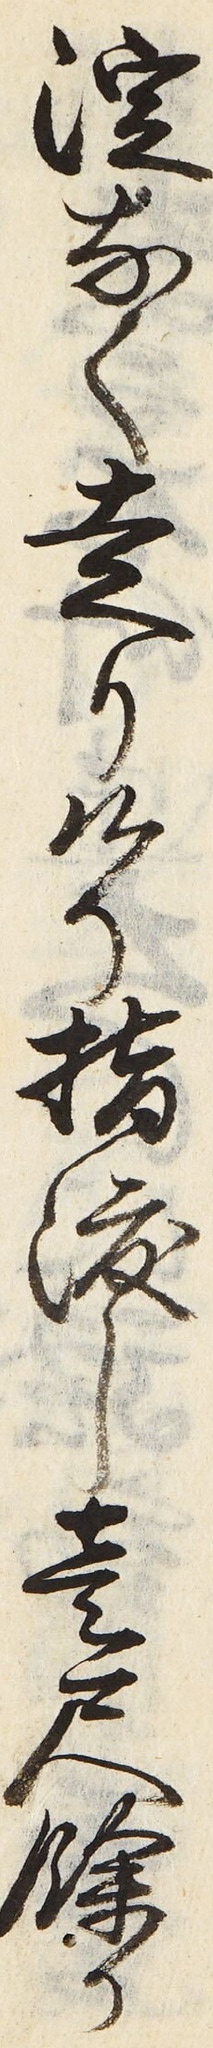淀なく走りけり指渡し壱尺余り
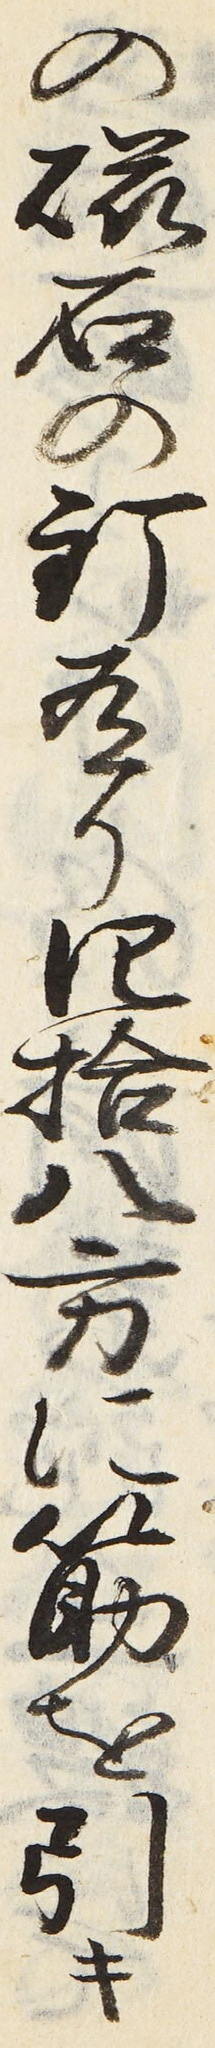の磁石の釘有り四拾八方に筋を引き
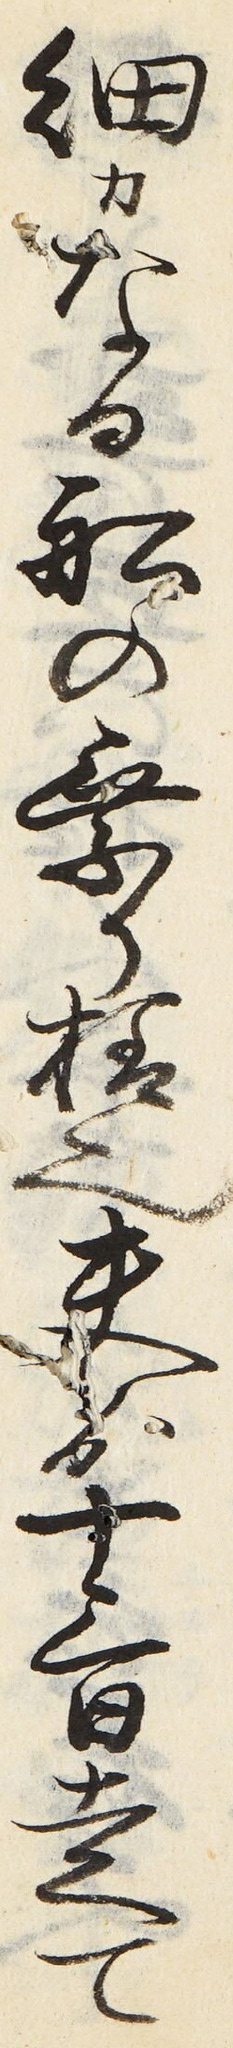細かなる船の乗り様也夫ゟ十三日走て
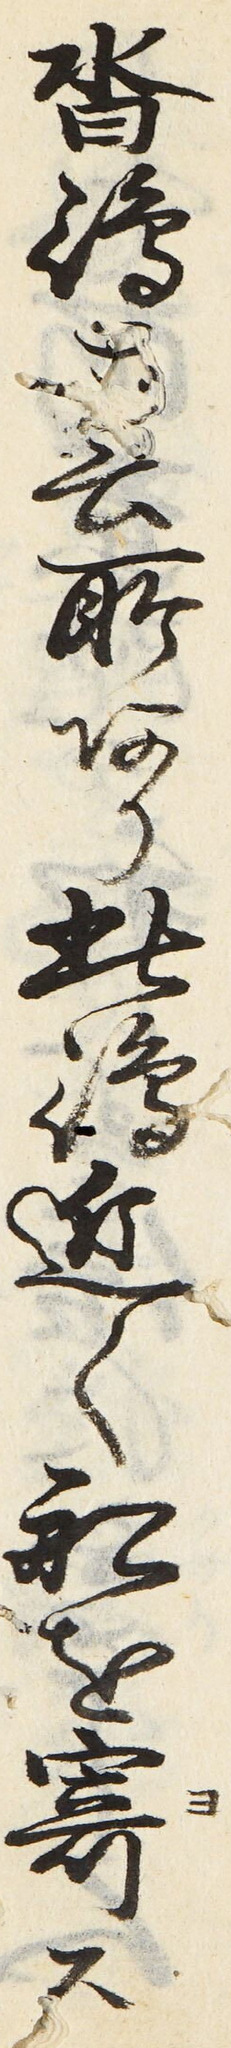沓嶋と云所あり此嶋近く船を寄す
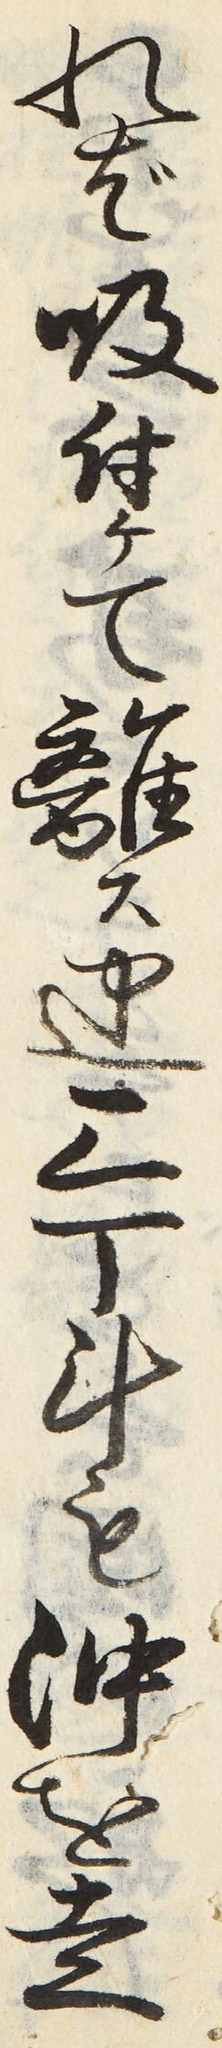れば吸付けて離す迚三丁計も沖を走
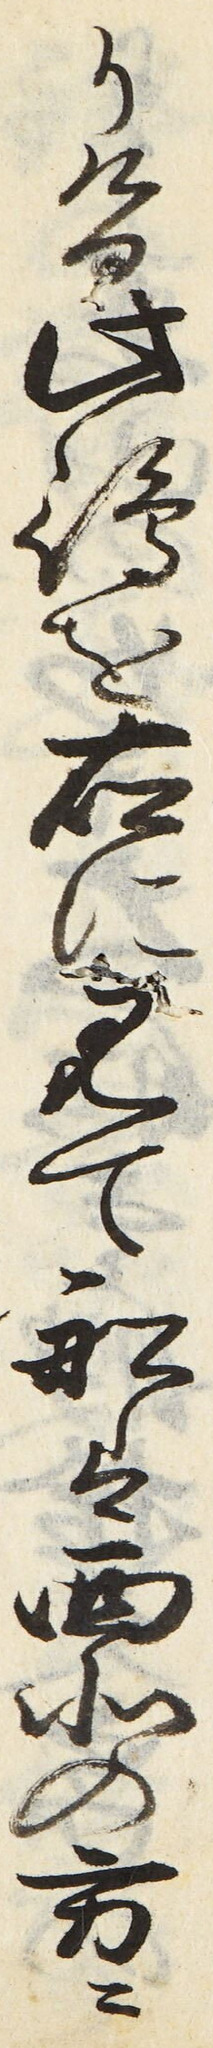りける此嶋を右に見て船は西北の方に
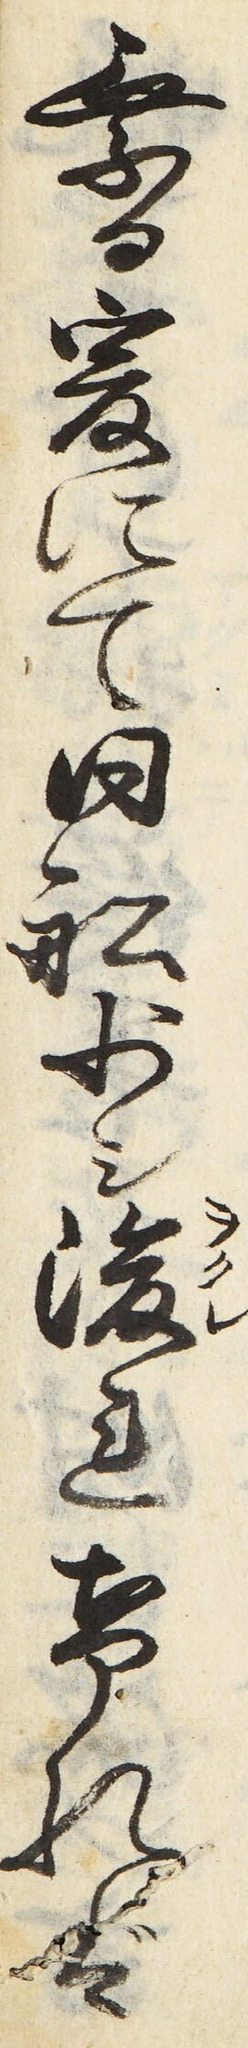乗る爰にて同船少し後れければ

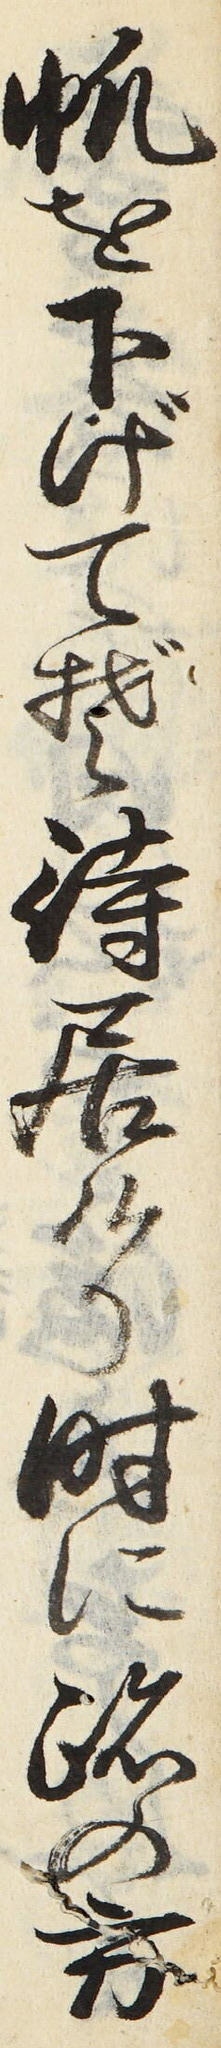帆を下げてぞ待居けり時に跡の方
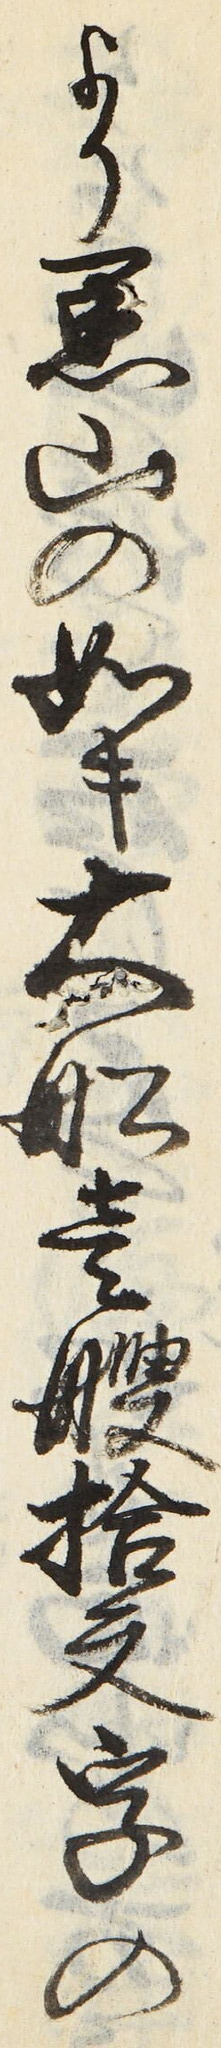より黒山の如き大船壱艘拾文字の
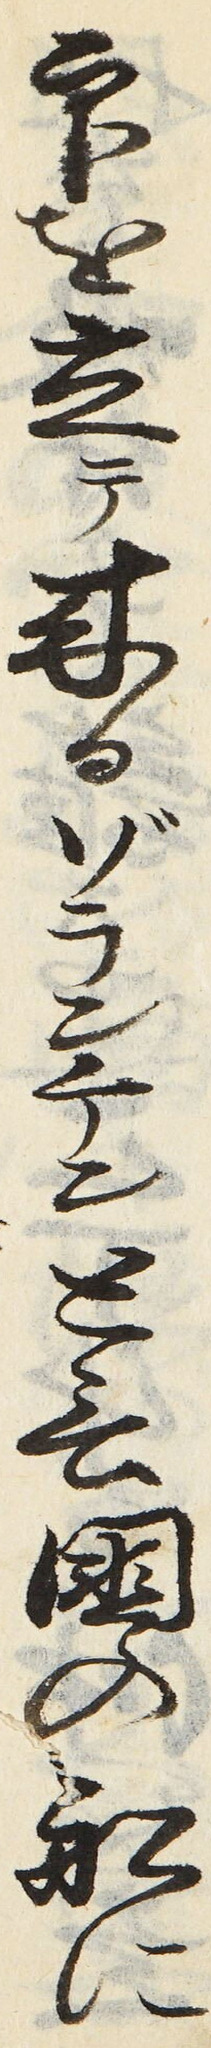印を立て来るゾランケンと云国の船に
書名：華夷九年録
